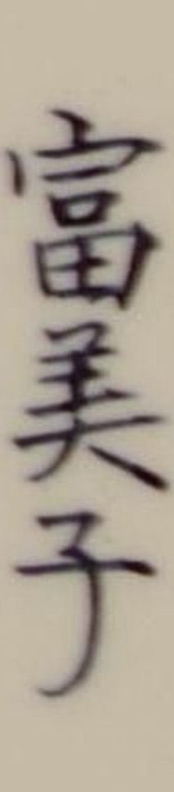富美子
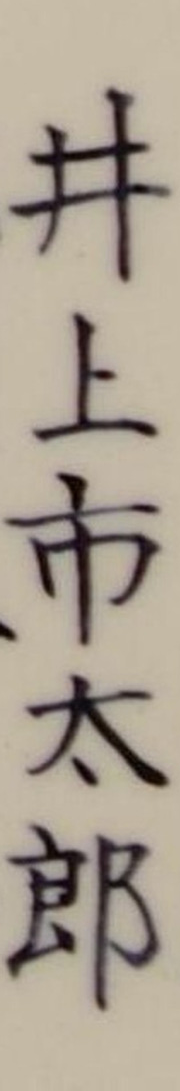井上市太郎
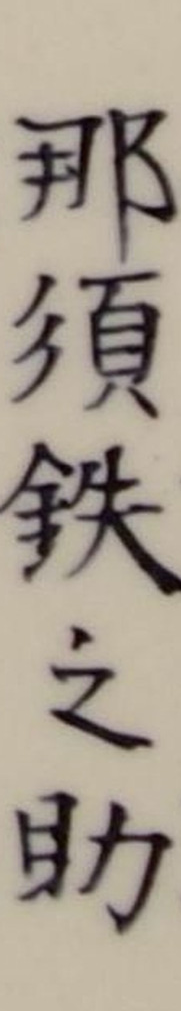那須鉄之助
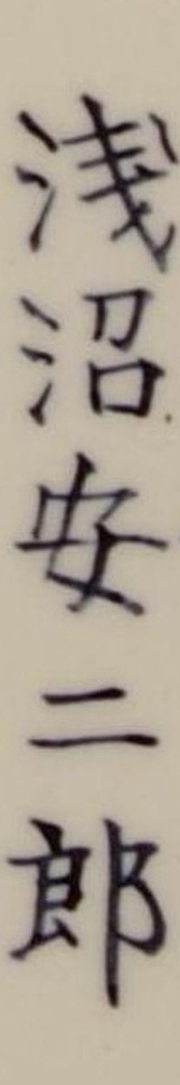浅沼安二郎
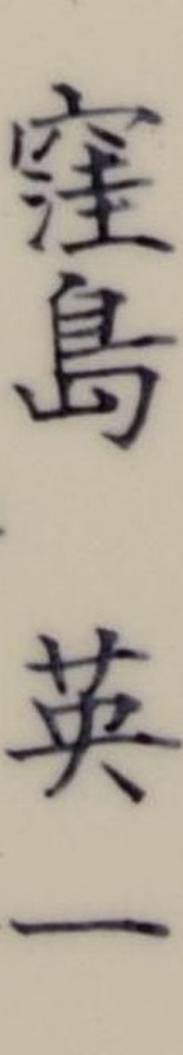窪島英一
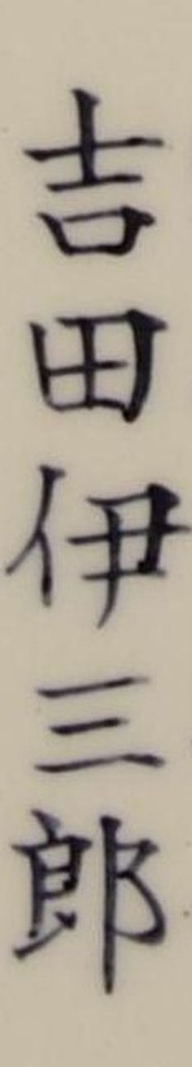吉田伊三郎
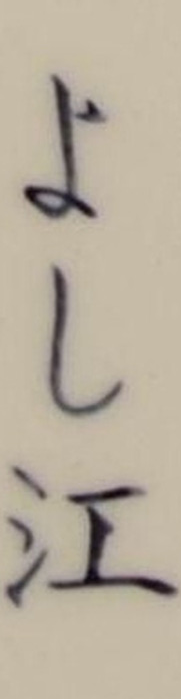よし江
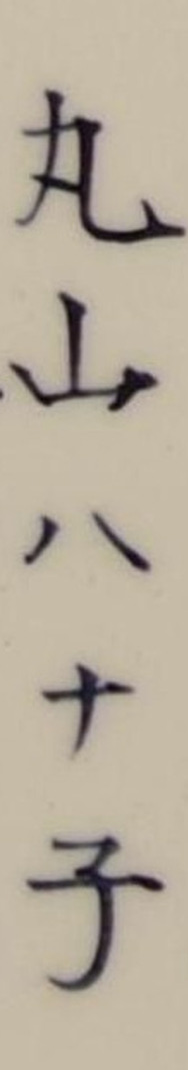丸山ハナ子
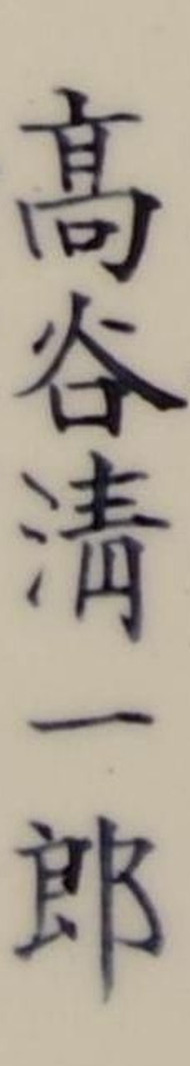高谷清一郎
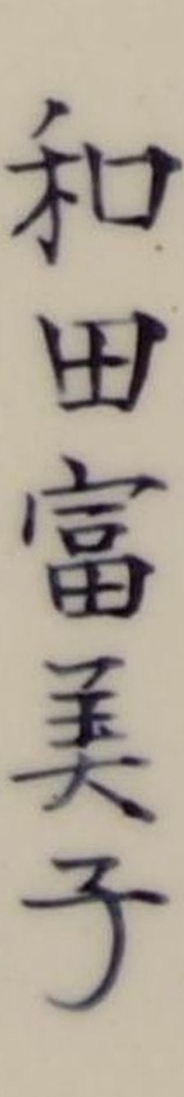和田富美子
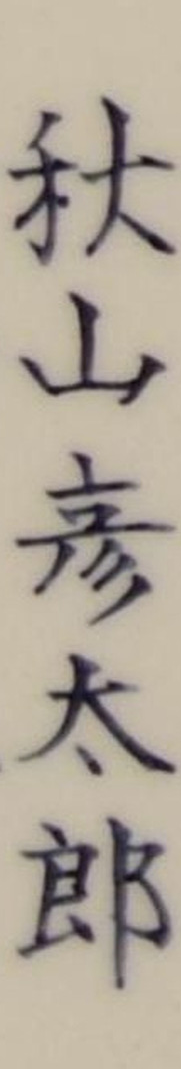秋山彦太郎
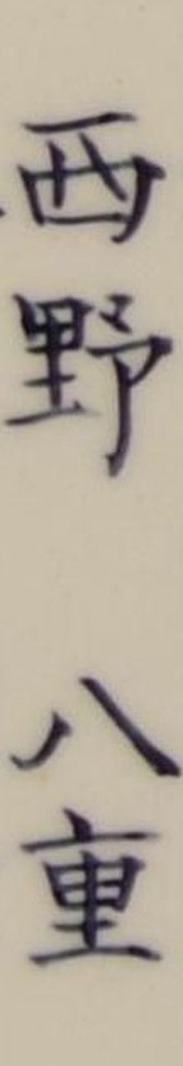西野八重

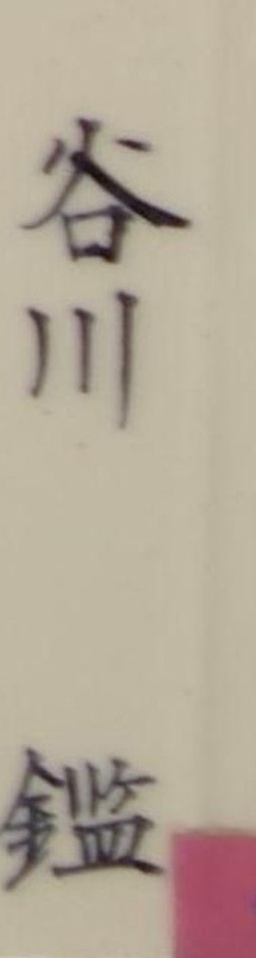谷川鑑
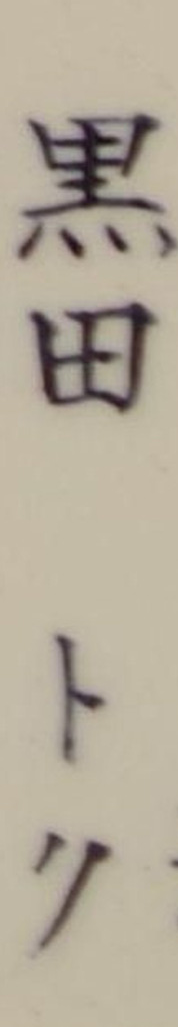黒田トク
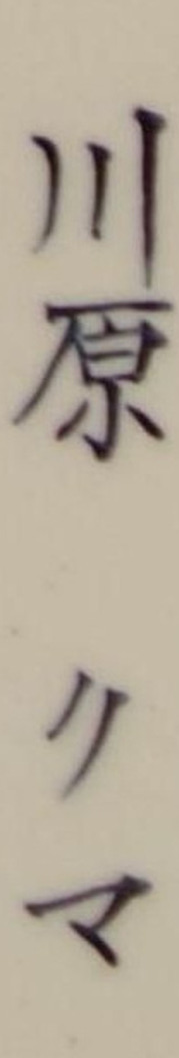川原クマ
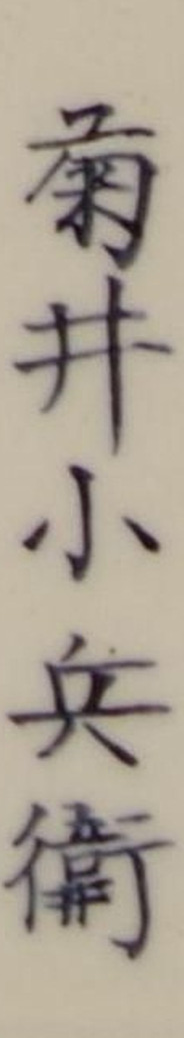菊井小兵衛
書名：M~S
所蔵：高野山金剛峯寺
